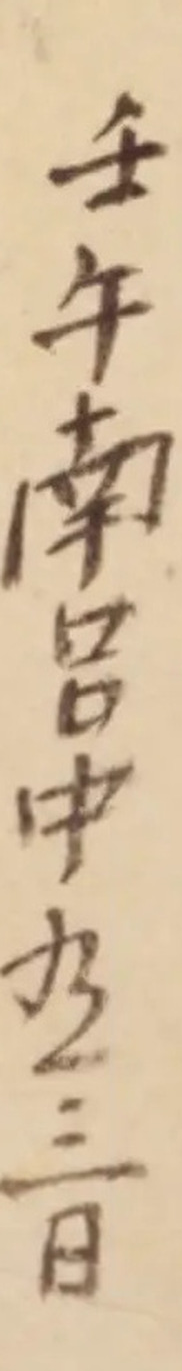壬午南呂中有三日
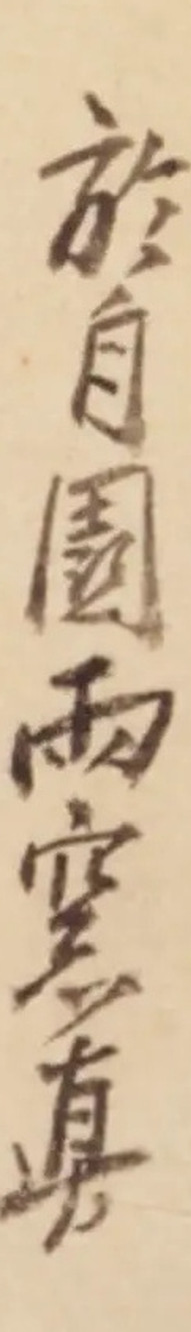於自園雨窓真
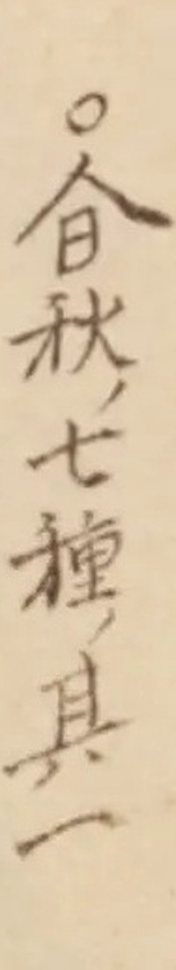◦秋七種其一
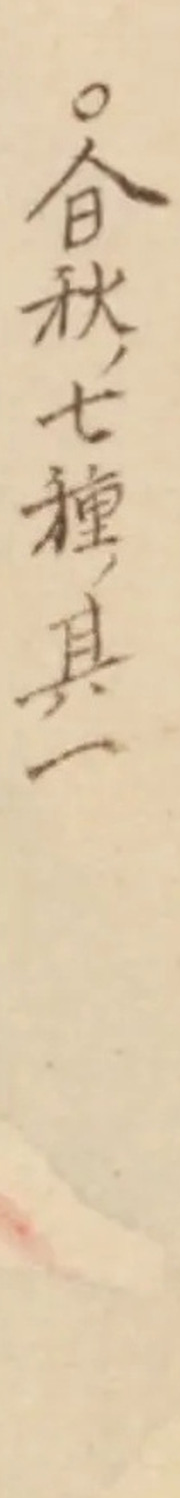◦秋七種其一
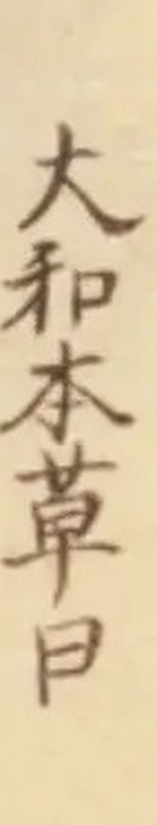大和本草曰
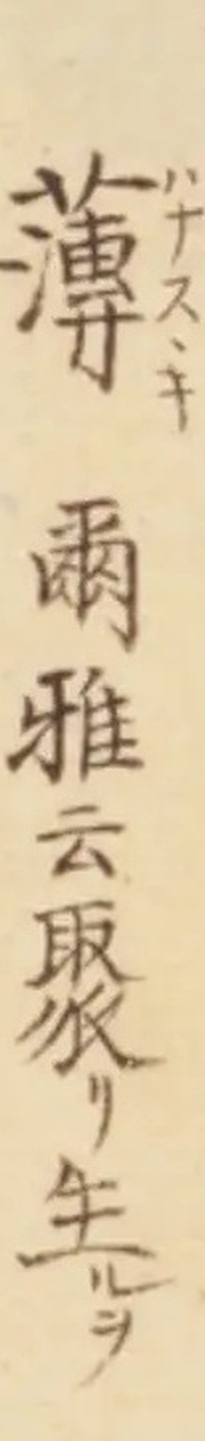薄爾雅云聚生
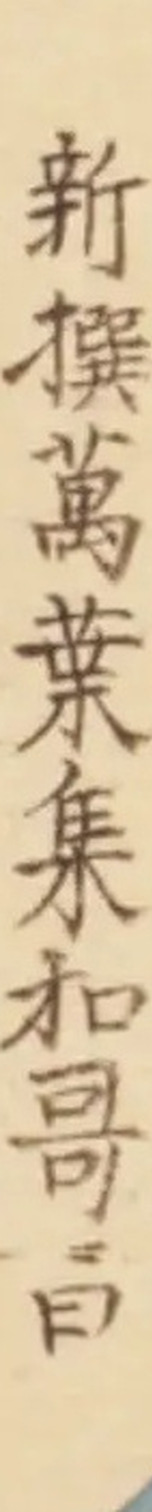新撰万葉集和哥曰
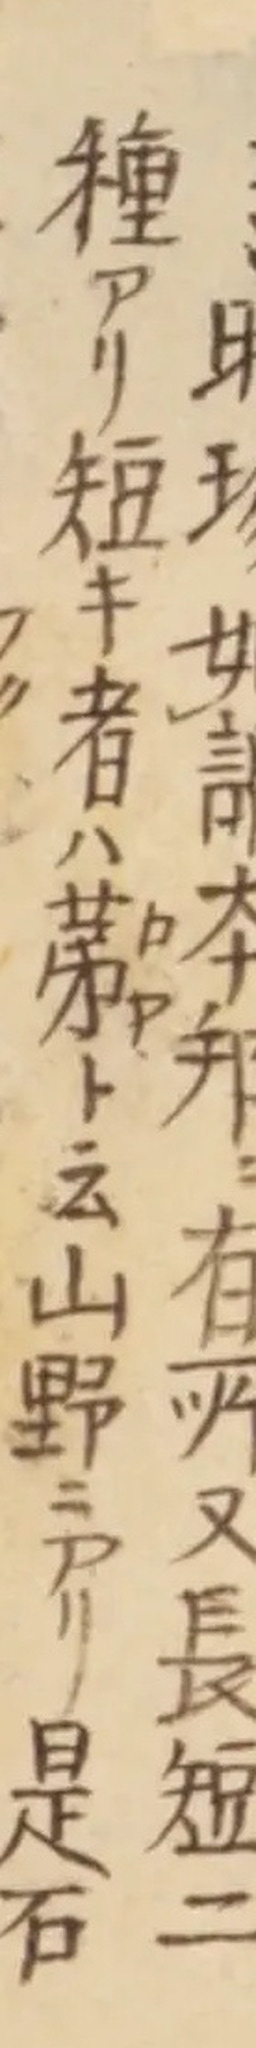種アリ短キ者ハ茅ト云山野是石
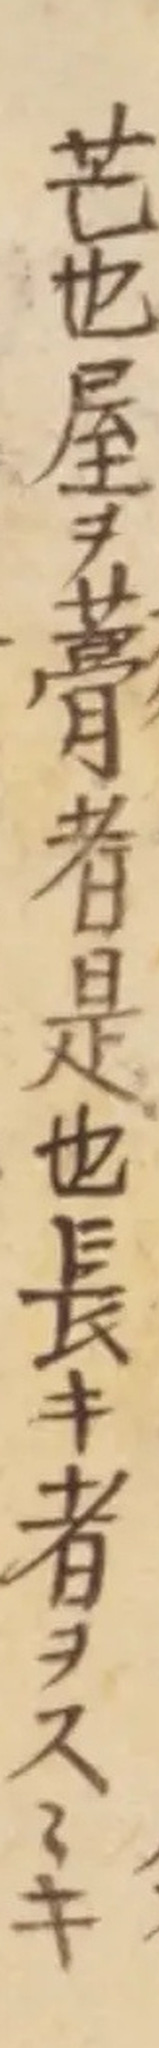芒也屋ヲ者是也長キ者ヲス〻キ
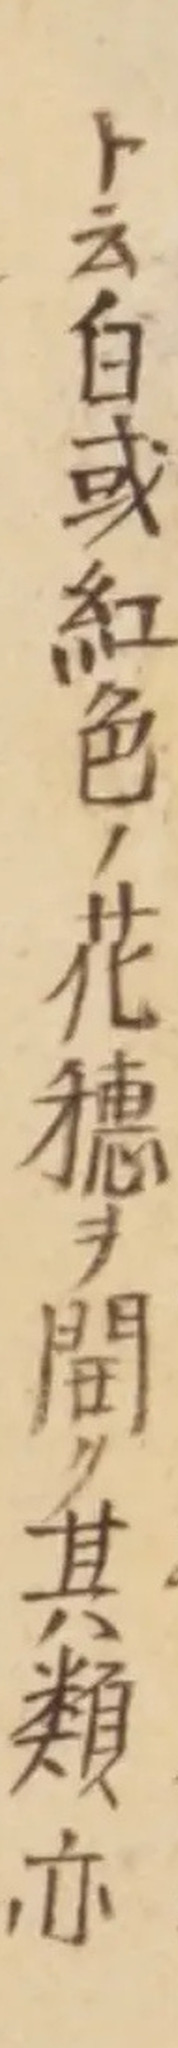ト云白或紅色ノ花穂ヲ開ク其類亦
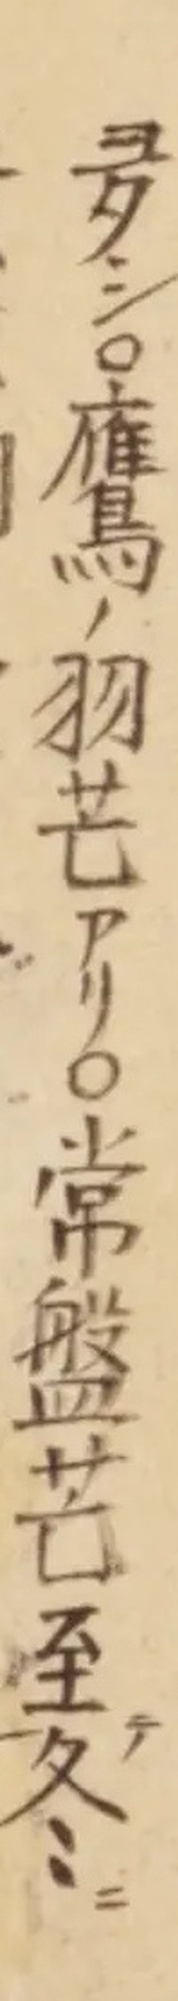多シ○鷹ノ羽芒アリ○常盤芒至冬
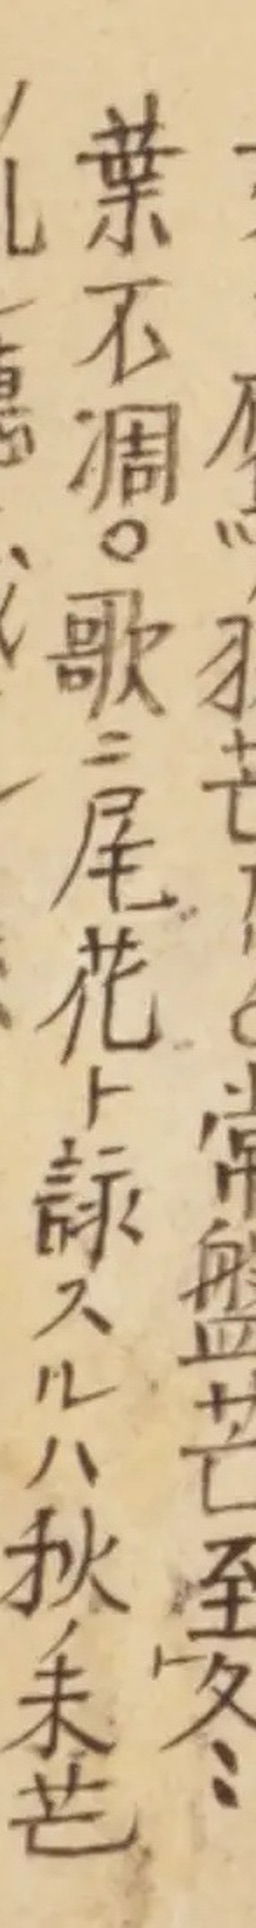葉不凋○歌ニ尾花ト詠スルハ秋ノ未芒
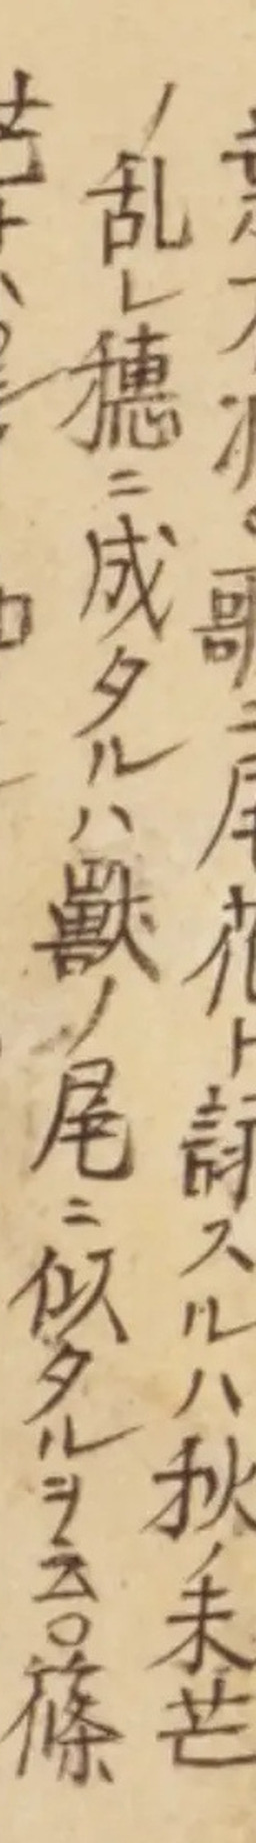ノ乱レ穂ニ成タルハ獣ノ尾ニ似タルヲ云○篠
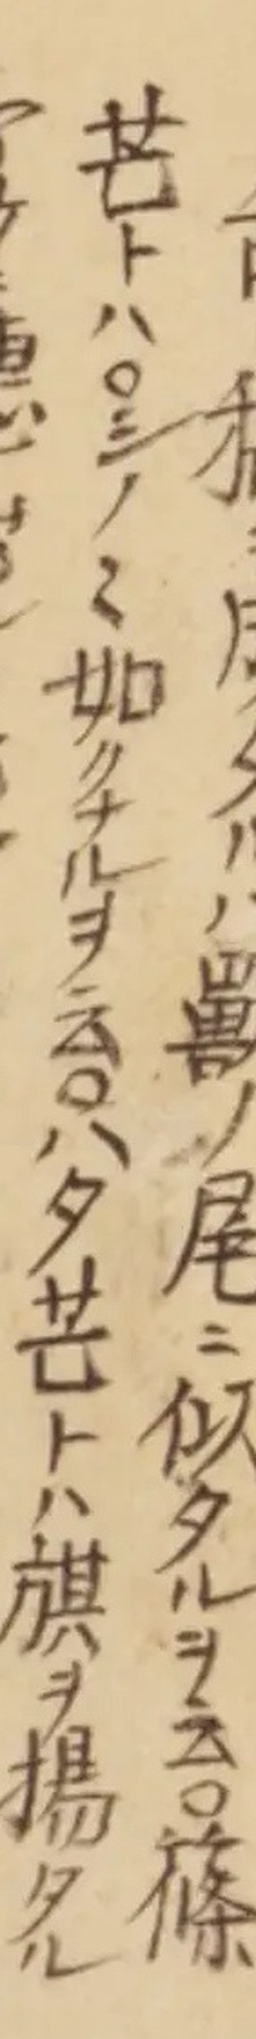芒トハ○シノ〻如クナルヲ云○ハタ芒トハ旗ヲ揚タル
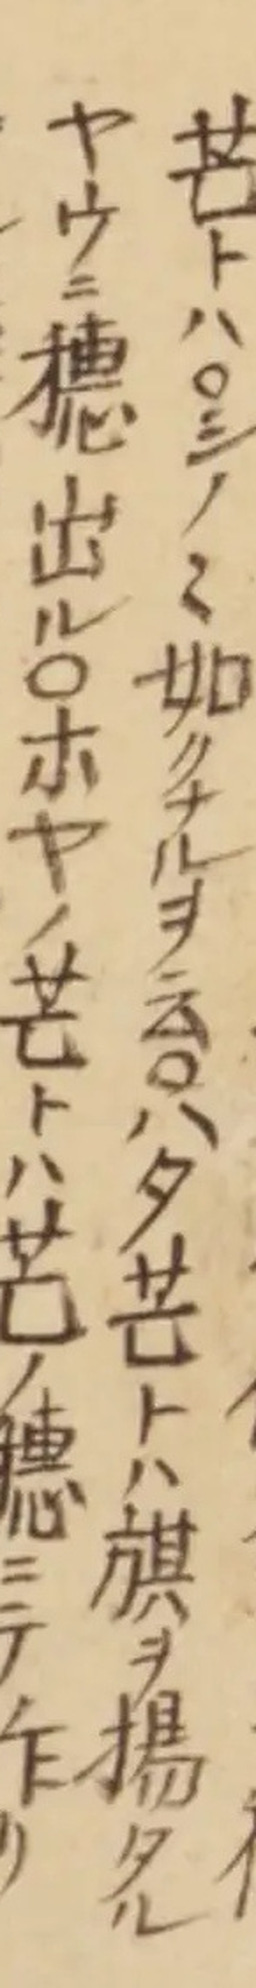ヤウニ穂出ル○ホヤノ芒トハ芒ノ穂ニテ作リ
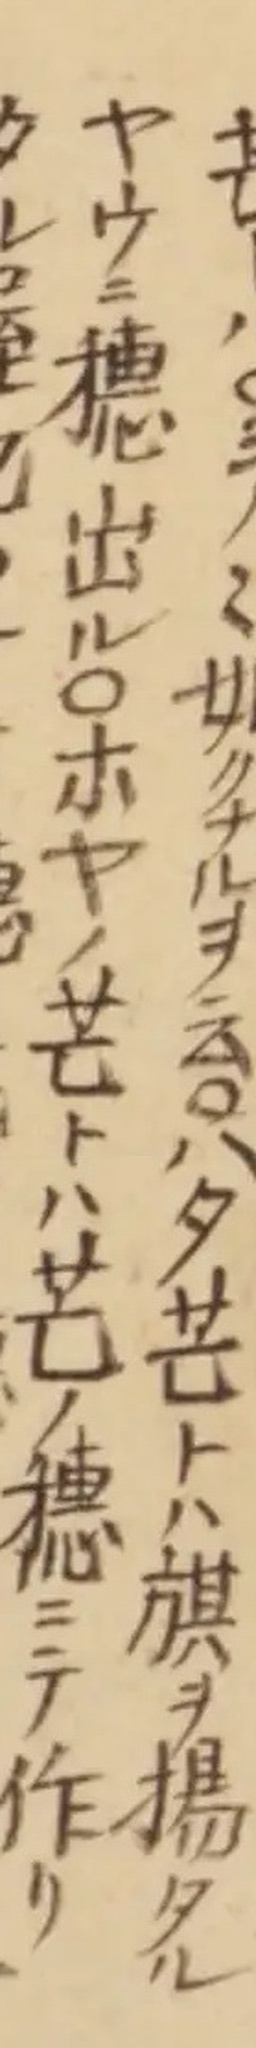ヤウニ穂出ル○ホヤノ芒トハ芒ノ穂ニテ作リ
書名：梅園草木花譜秋之部. 1
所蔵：国立国会図書館 National Diet Library, JAPAN
